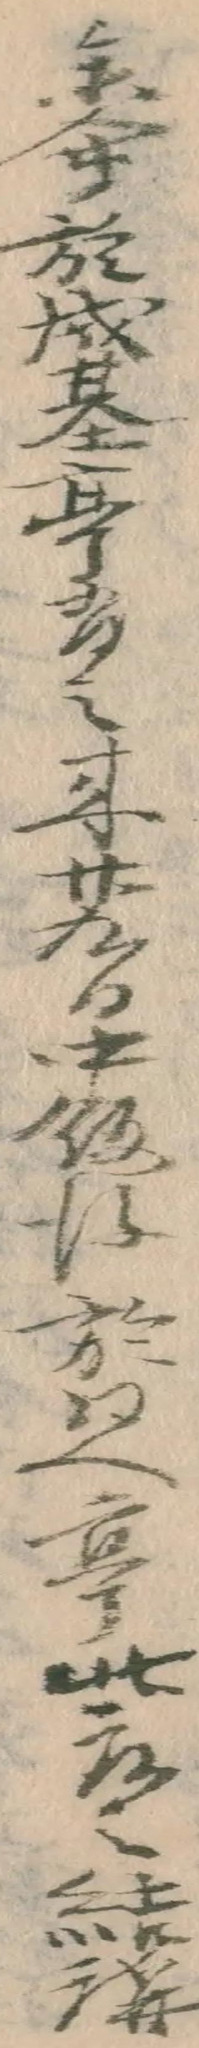参會於成基亭有之来廿九日中飯後於同人亭此度之結講
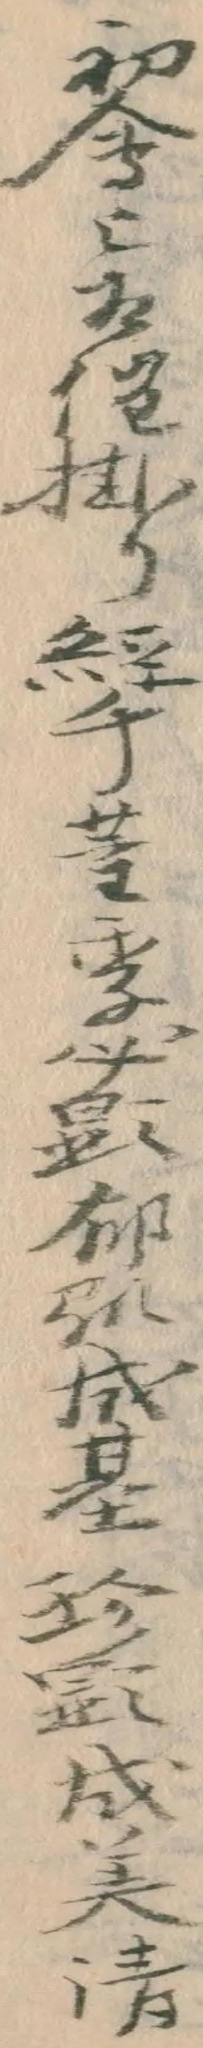初會被召相催掛り経千董季必顕郁顕成基珍顕成美清
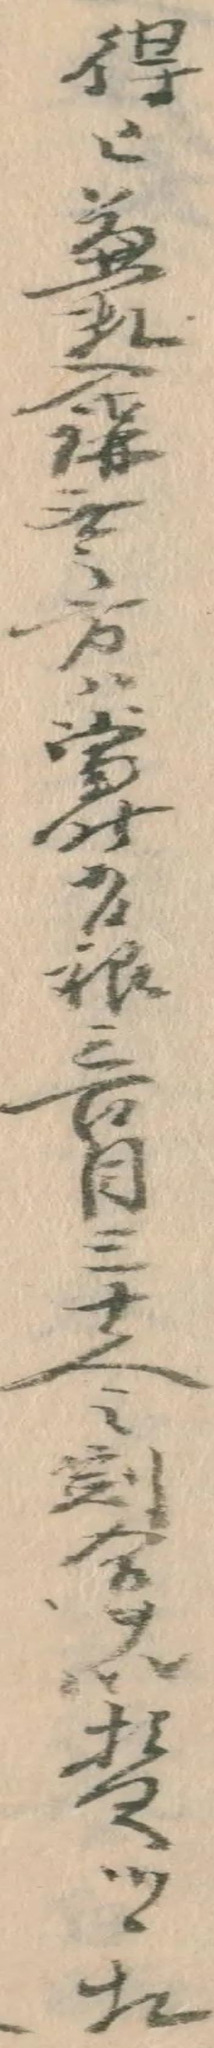得被兼頼入講無之方ハ當時有銀三百目三十人之割合ヲ以十匁ツヽ相
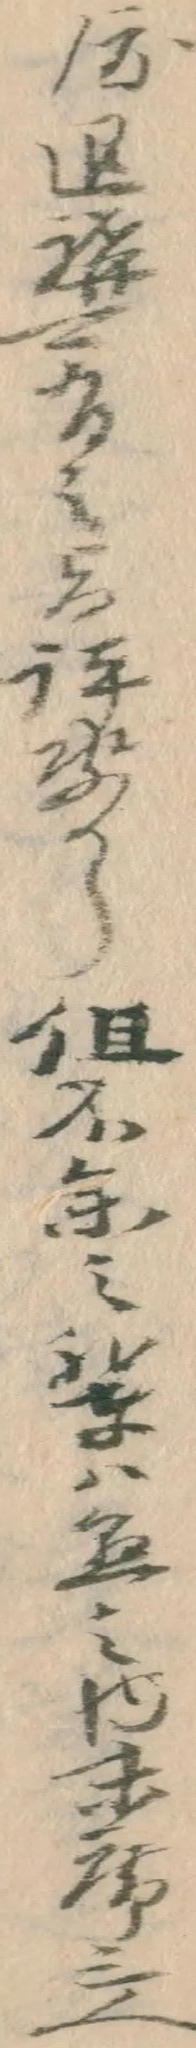渡退講可有之旨評決了但不参之輩ハ惣之内末席三人
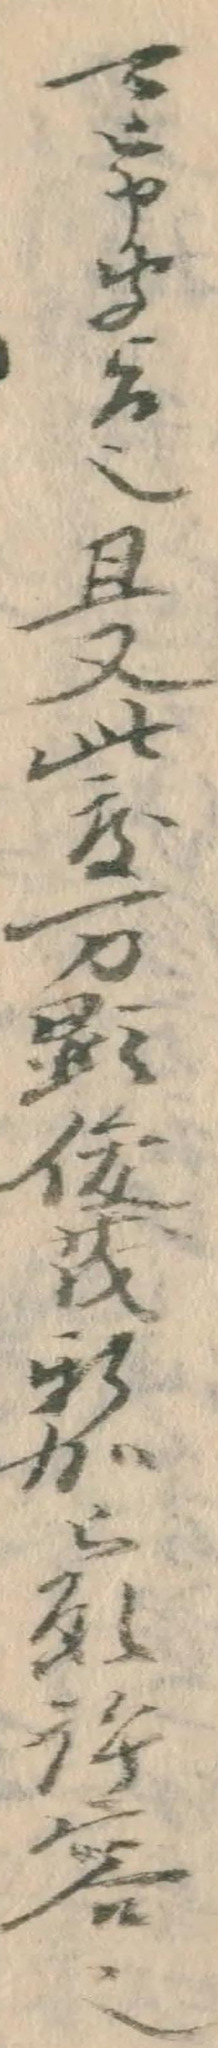可被申聞旨也且又此度万顕俊茂新加被願許容也
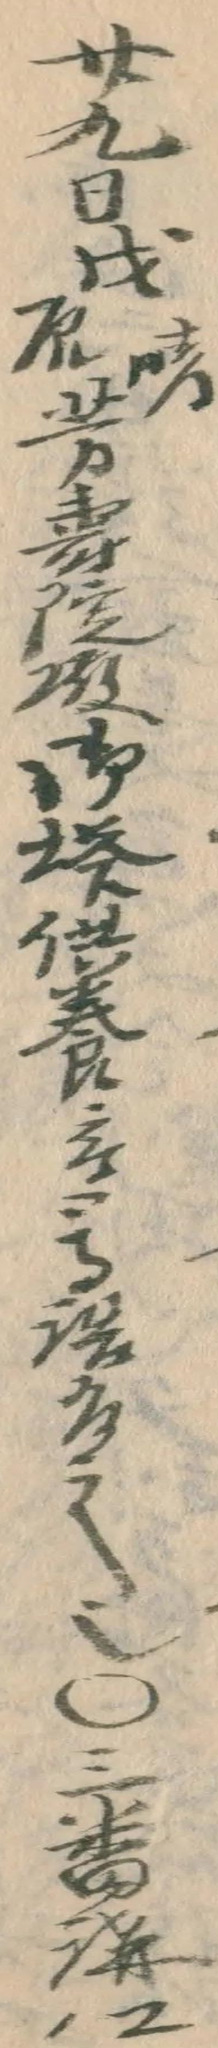廿九日戊辰晴芳壽院殿御塔供養ニ付御高場有之也○三番講郷
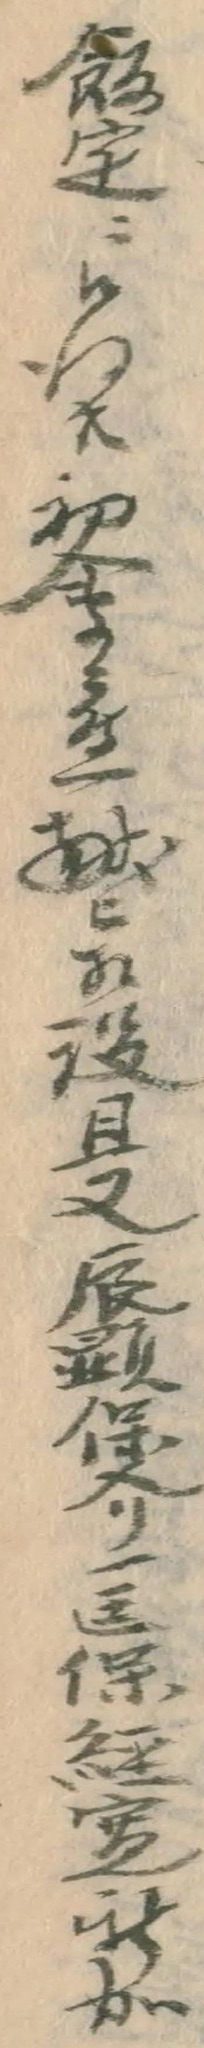飯定ニ候得共初會ニ付一献被相設且又辰顕保介匡保経寛新加

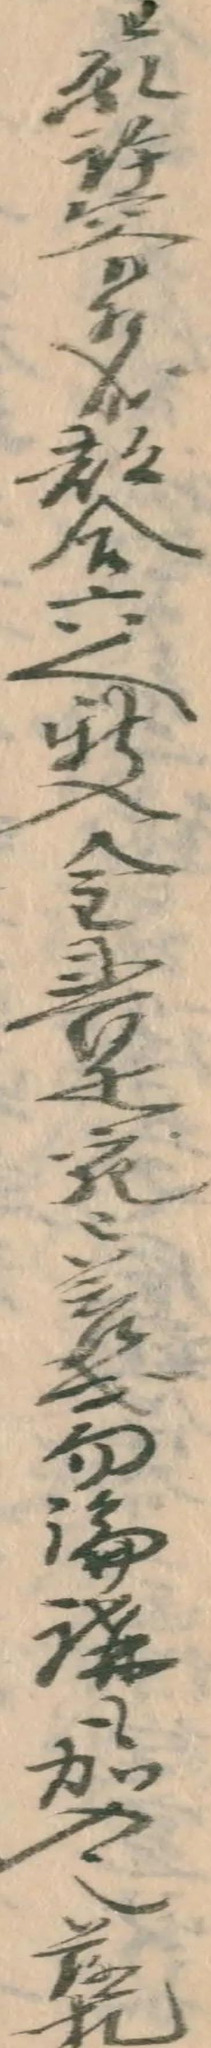被願許容相成都合六人新入金弐百疋宛被差出勿論講も加入也落札
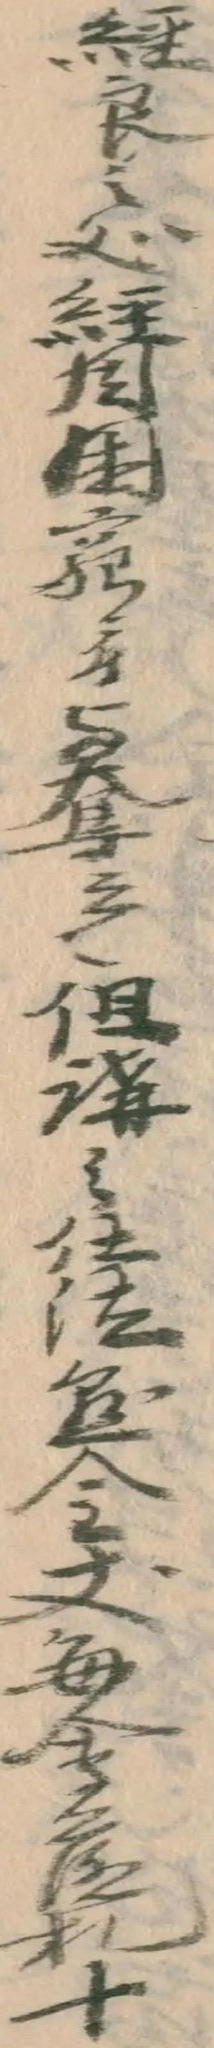経良之処経周困窮ニ付与奪云々但講之仕法懸金丈毎會落札十
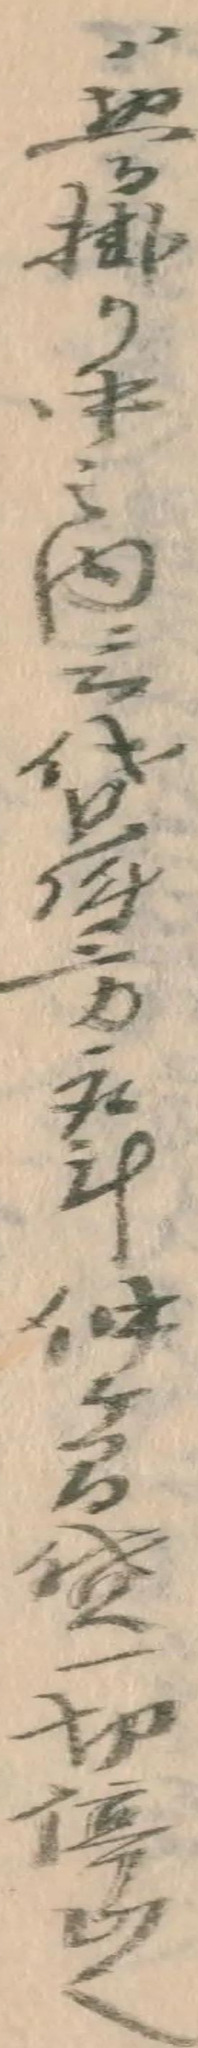ハ惣而掛り中之内ニ而貸附方取斗仲ヶ間貸一切停止也
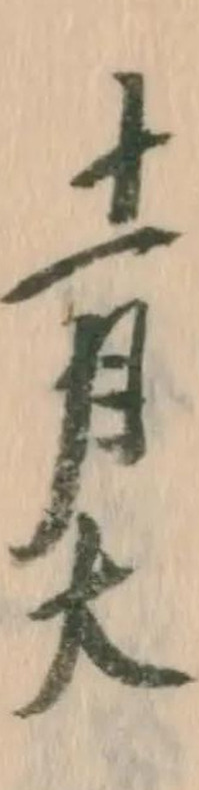十一月大
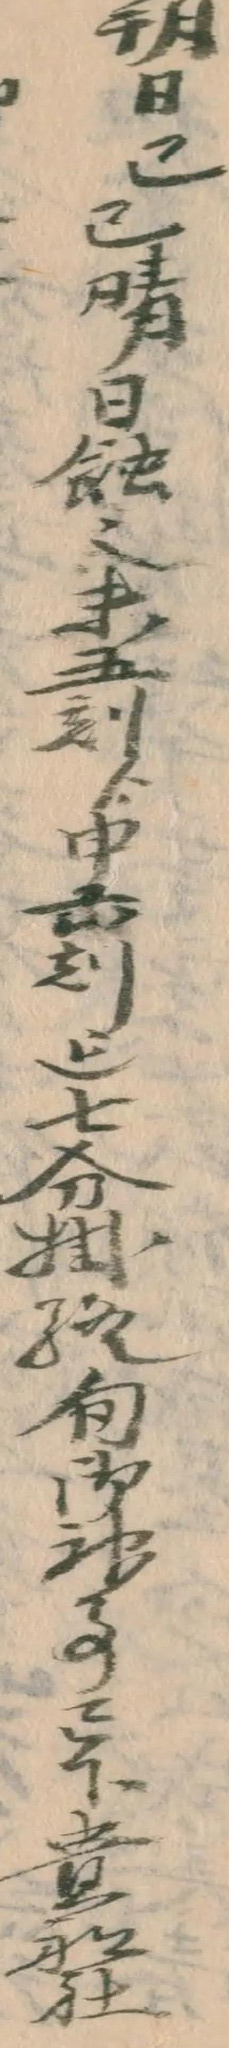朔日己巳晴日蝕也未五刻ゟ申五刻迄七分掛終旬御神事已下貴舩社
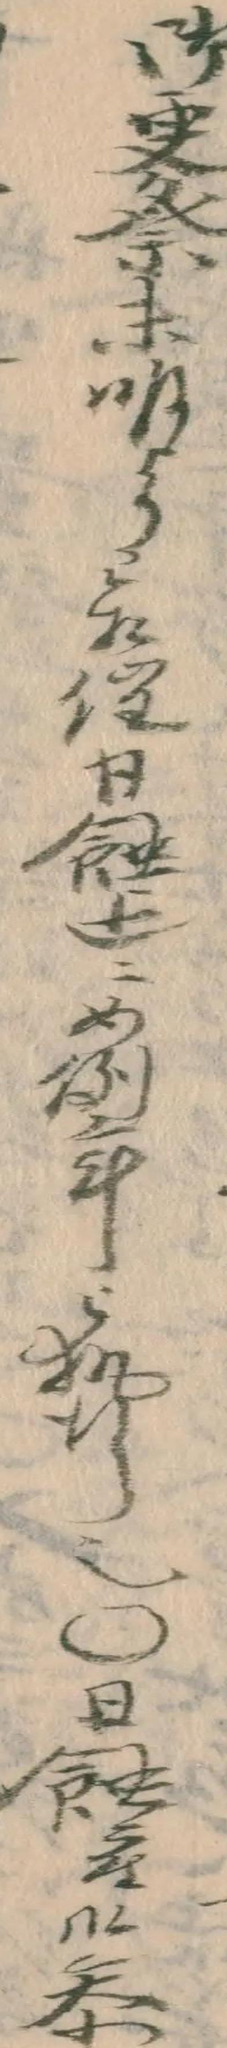御更祭未明より被相催日蝕迄ニ如例年被執行也○日蝕ニ付御参
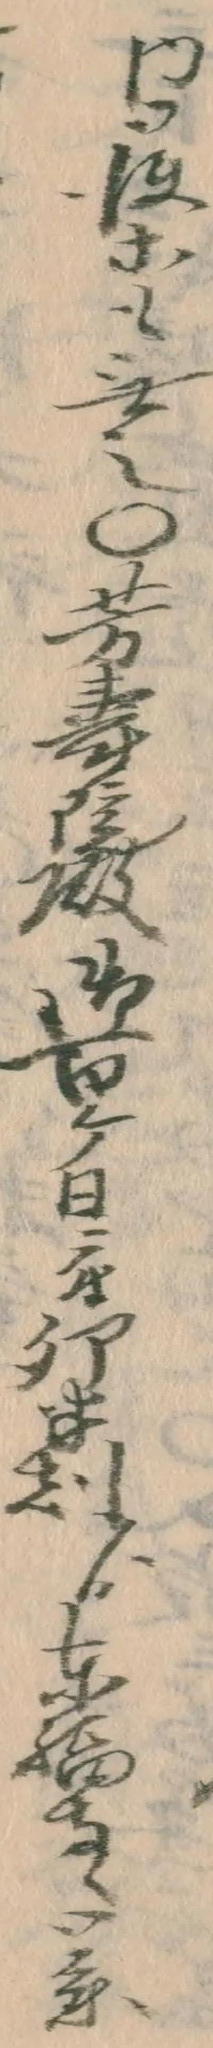内御役等も無也○芳壽院殿御百ヶ日ニ付卯半刻ゟ東福寺へ御参
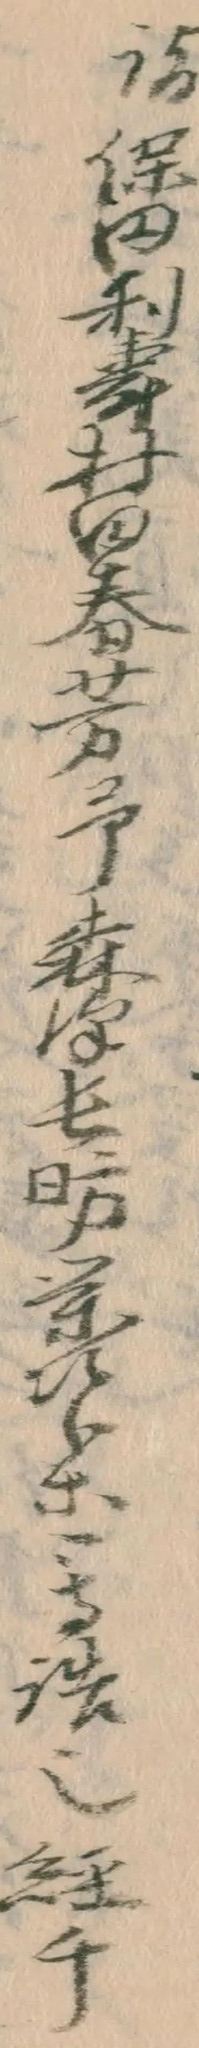詣保田利壽村田春芳予森次長助栄次郎等御寺詰也経千
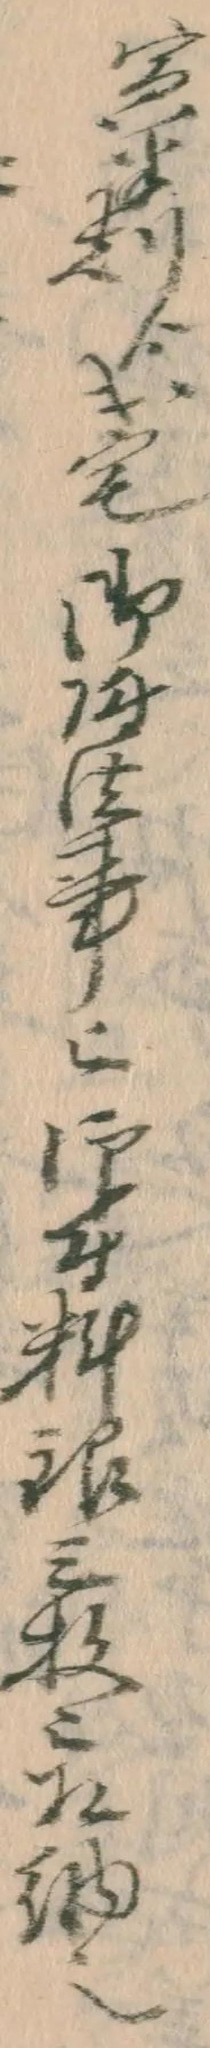寅半刻ゟ出宅御附法事被仰付料銀三枚被相納也
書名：賀茂社記録. 第69冊
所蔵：国立国会図書館 National Diet Library, JAPAN
